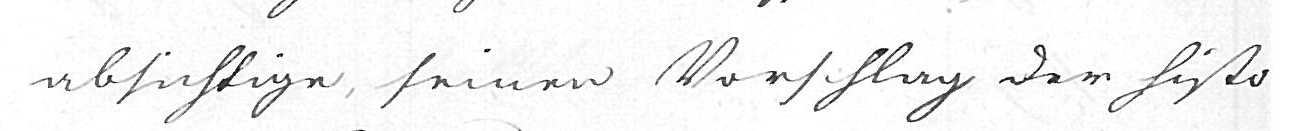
absichtige, seinen Vorschlag der histo-
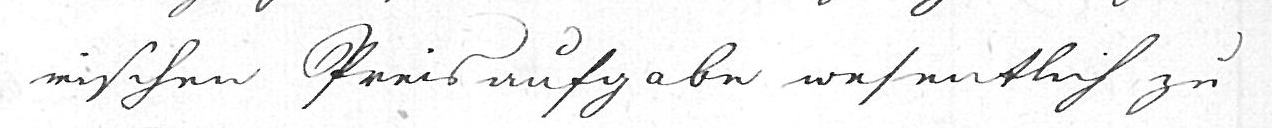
rischen Preisaufgabe wesentlich zu
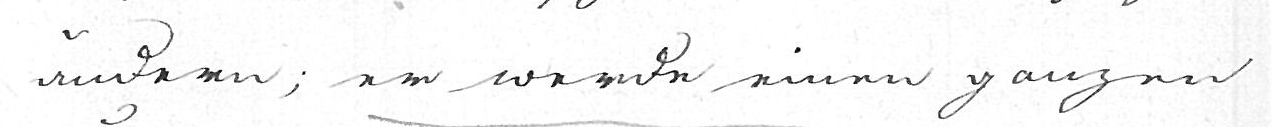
ändern, er werde einen ganzen
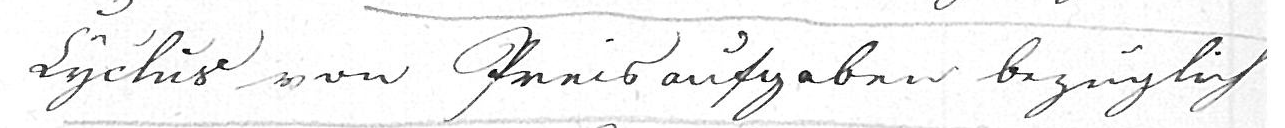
Cychis von Preisaufgaben bezüglich
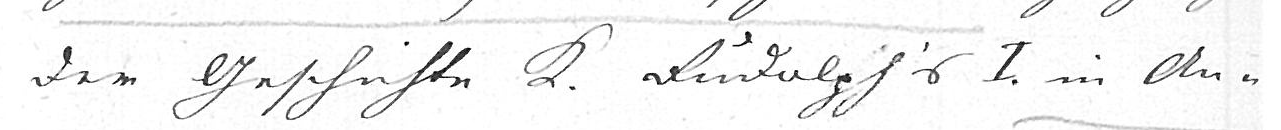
der Geschäfte K. Rudolph's I. in An-
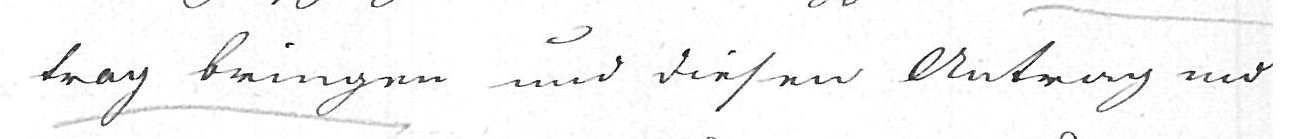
trag bringen unddiesen Antrag mo-
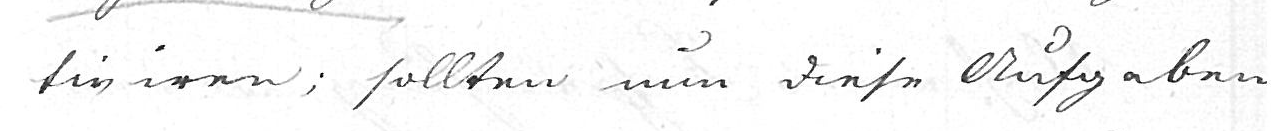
tiviren; sollten nun diese Aufgaben
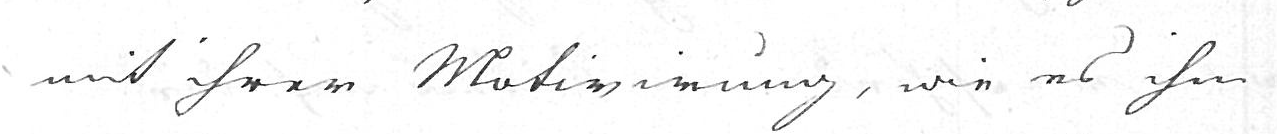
mit ihrer Motivirung, wie es ihm
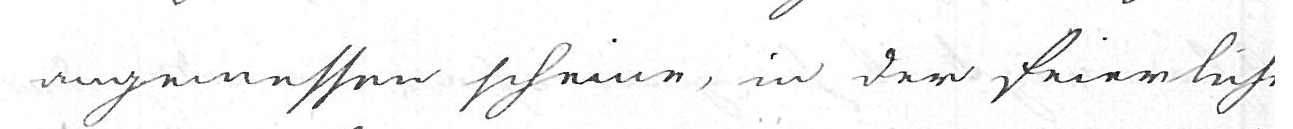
angemessen erscheine, in der feierlichen
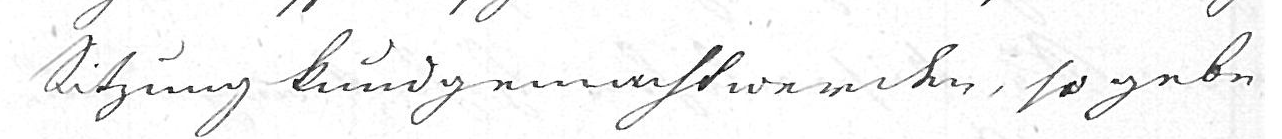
Sitzung kundgemacht werden, so gebe
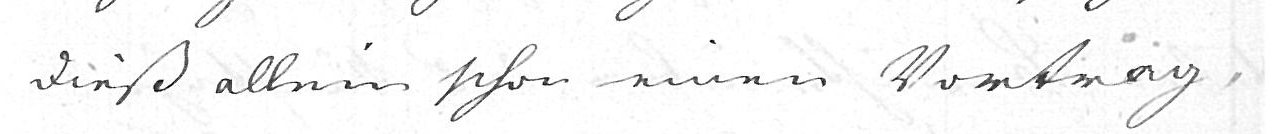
dieß allein schon einen Vortrag
